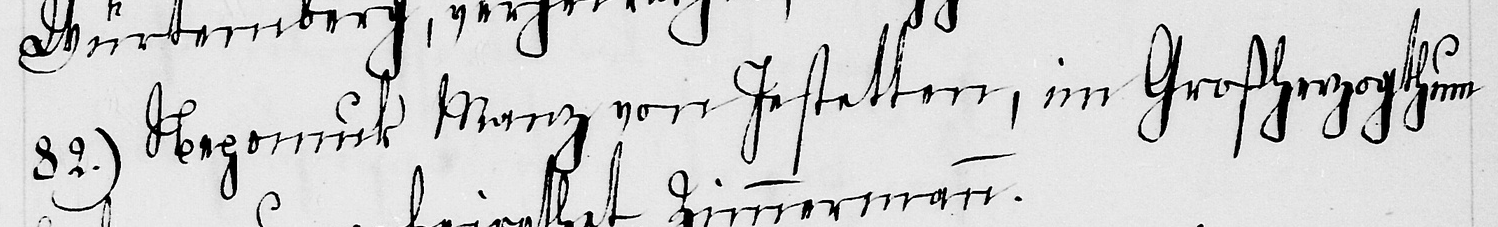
82.) Nepomuk Manz von Jestetten, im Großherzogthum
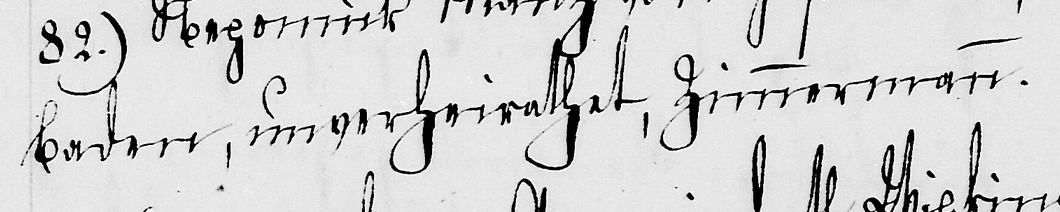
Baden, unverheirathet, Zimmermann.
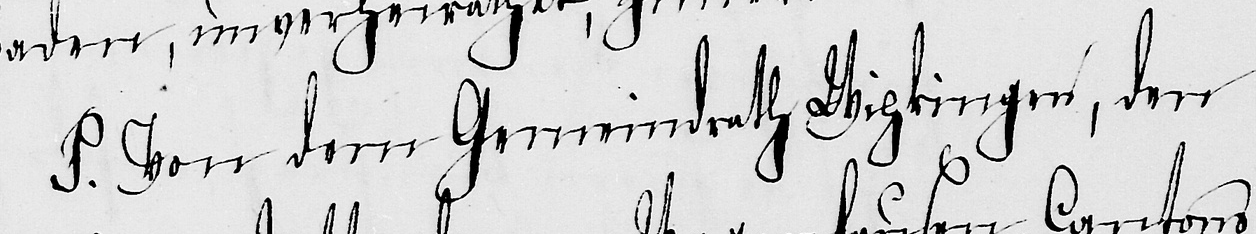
P. Von dem Gemeindrath Wipkingen, den
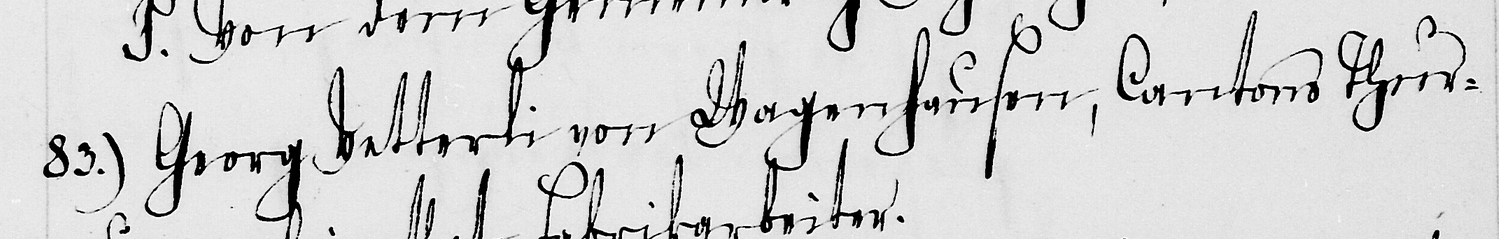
83.) Georg Vetterli von Wagenhausen, Cantons Thur¬
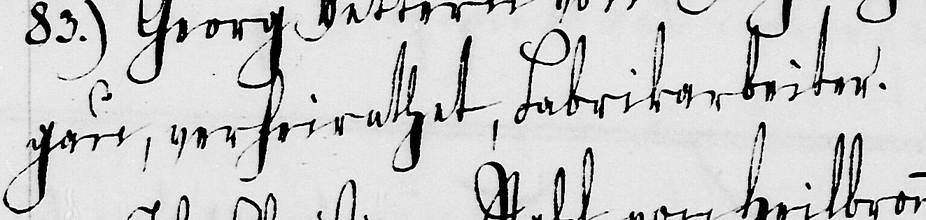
gau, verheirathet, Fabrikarbeiter.
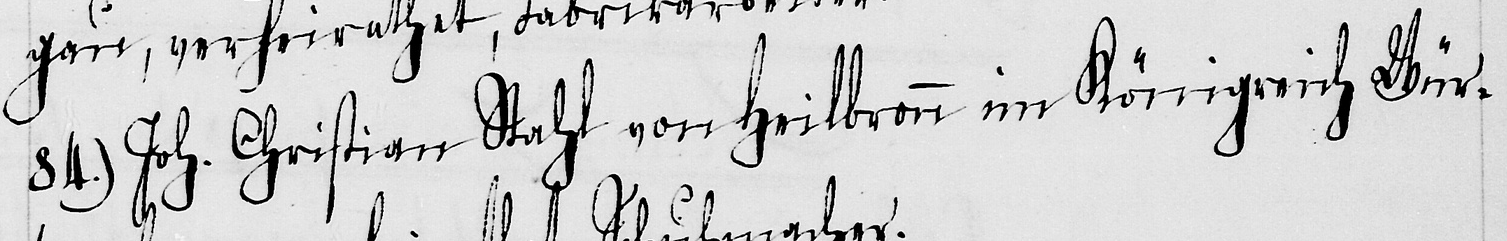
84.) Joh. Christian Stahl von Heilbronn im Königreich Wür¬
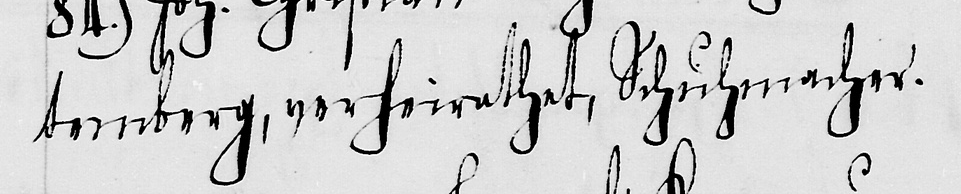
temberg, verheirathet, Schuhmacher.
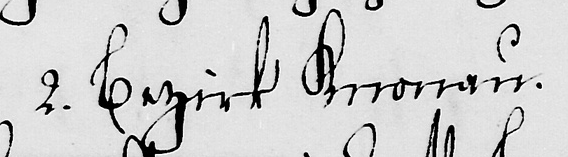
2. Bezirk Knonau.
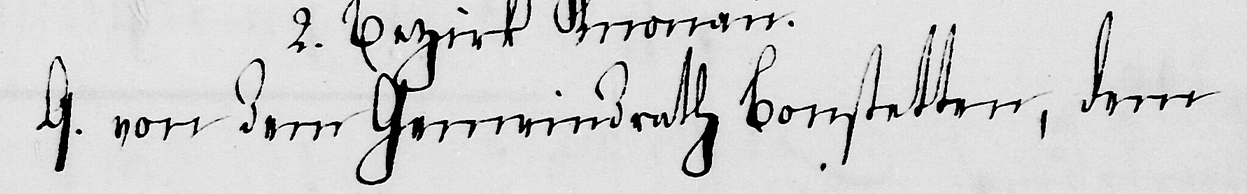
Q. Von dem Gemeindrath Bonstetten, dem
